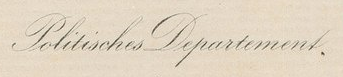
Politisches Departement
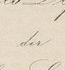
der
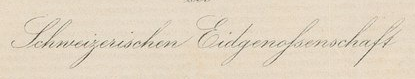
Schweizerischen Eidgenossenschaft
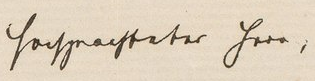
Hochgeachteter Herr,
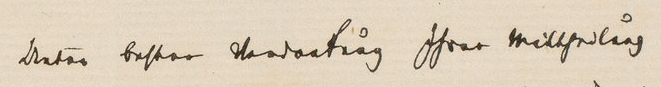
Unter bester Verdankung Ihrer Mittheilung
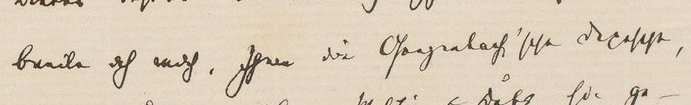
beeile ich mich, Ihnen die Gonzenbach`sche Depesche,
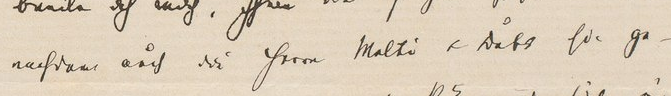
nachdem auch die Herrn Welti & Dubs sie ge-
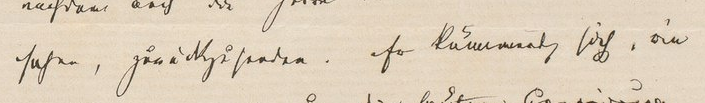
sehen, zurückzusenden. Er kümmert sich, wie
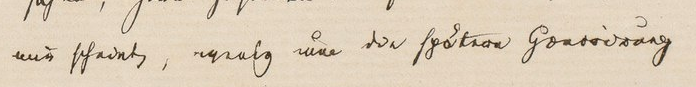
mir scheint, wenig um die spätere Grossirung
